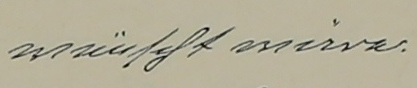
wünscht wäre.
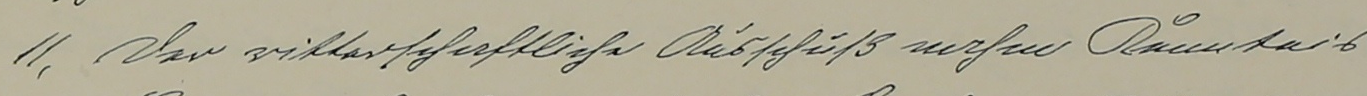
11. Der ritterschaftliche Ausschuß nahm Kenntnis
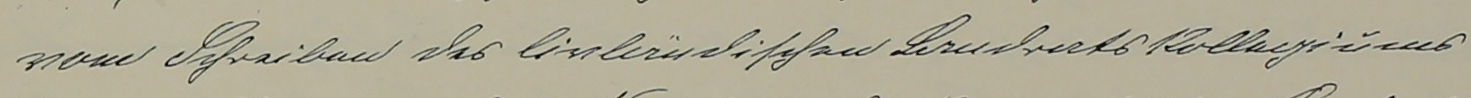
vom Schreiben des livländischen Landratskollegiums
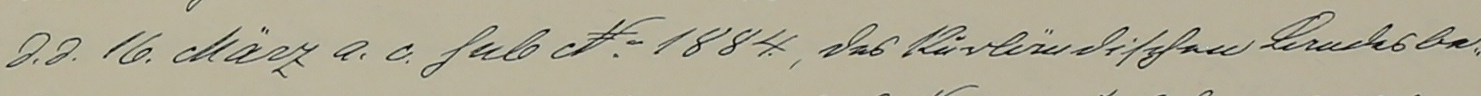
d.d. 16. März a.c. sub No. 1884, des kurländischen Landesbe-
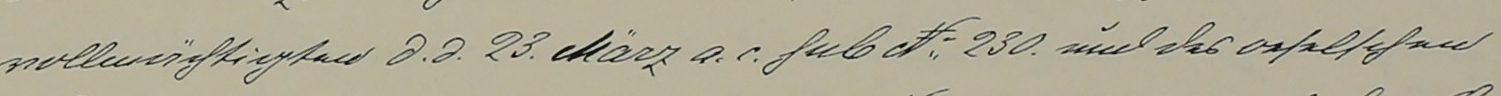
vollmächtigten d.d. 23. März a.c. sub No. 230. und des oeselschen
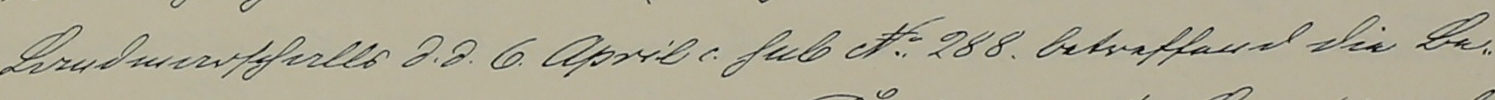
Landmarschalls d.d. 6. April c. sub No. 288. betreffend die Be-
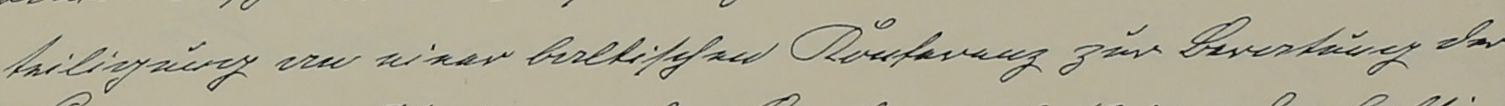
teiligung an einer baltischen Konferenz zur Beratung der
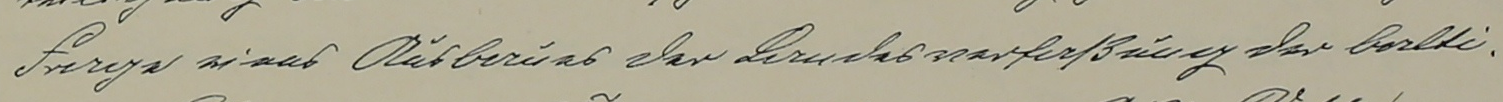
Frage eines Ausbaues der Landesverfaßung der balti-
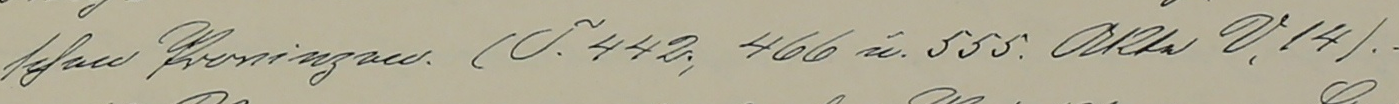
schen Provinzen (T. 442, 466 u. 555. Akte V.14).
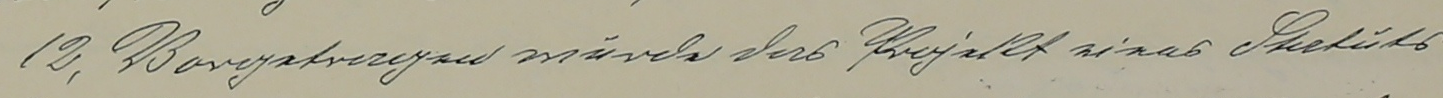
12. Vorgetragen wurde das Projekt eines Statuts
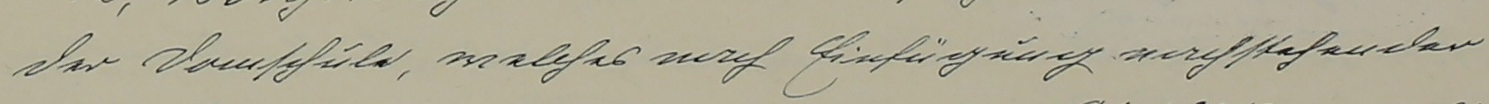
der Domschule, welches nach Einfügung nachstehender
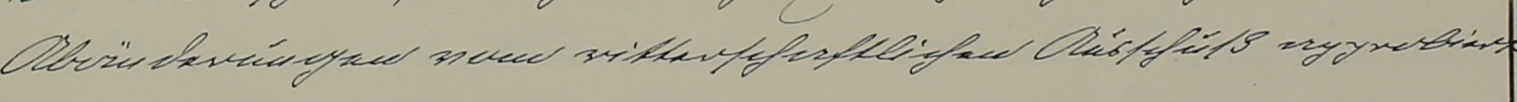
Abänderungen vom ritterschaftlichen Ausschuß approbiert
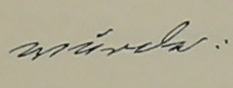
wurde:
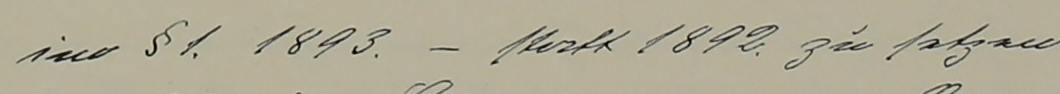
im § 1. 1893. – statt 1892. zu setzen
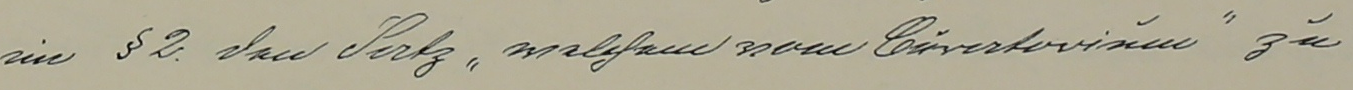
im § 2. den Satz „welchem vom Curatorium“ zu
